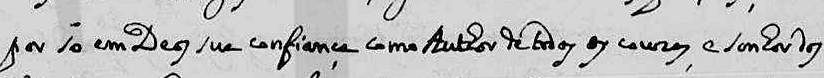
por só em Deos sua confiança como Author de todas as couzas, e senhor dos
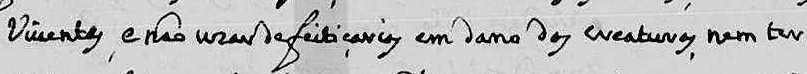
Viuentes, e naõ uzar de feitiçarias em dano dos creaturas, nem ter
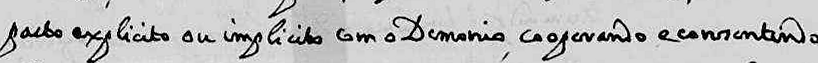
pacto explicito ou implicito com o Demonio, cooperando e consentindo
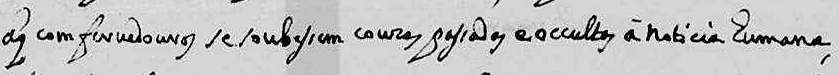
a q̄ com feruedouros se soubessem couzas passadas e occultas à noticia humana,
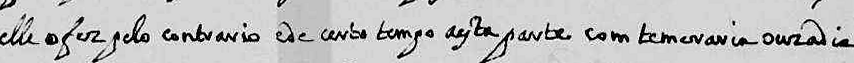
elle o fez pelo contrario e de certo tempo a esta parte com temeraria ouzadia
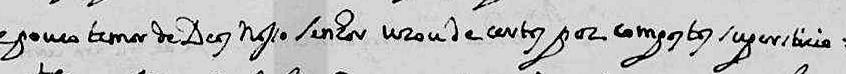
e pouco temor de Deos nosso Senhor uzou de certos poz compostos supersticio
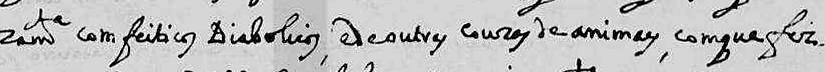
zam.te com feitiços Diabolicos, e de outras couzas de animaes, com que fez
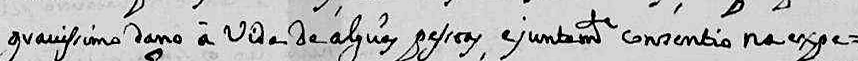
grauissimo dano à Vida de alguās pessoas, e juntamte consentio na expe
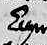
hum
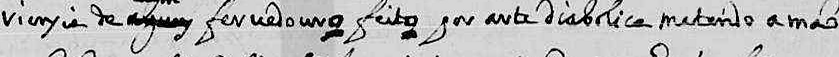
riensia de aguas feruedouro feito por arte diabolica metendo a maõ
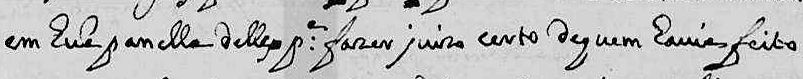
em huā panella delles p:a fazer juizo certo de quem hauia feito
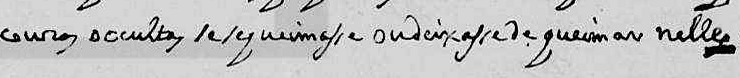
couzas occultas se se queimasse ou deixasse de queimar nelles.
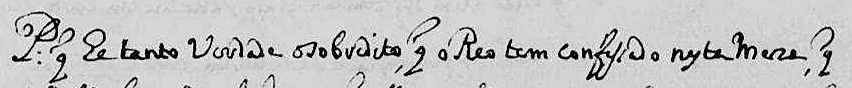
P: q̄ he tanto verdade o sobredito, q̄ o Reo tem confessado nesta meza, q̄
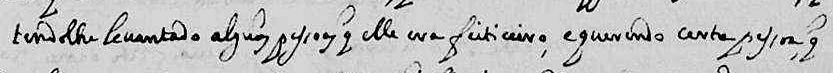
tendolhe leuantado alguās pessoas q̄ elle era feiticeiro, e querendo certa pessoa, q̄
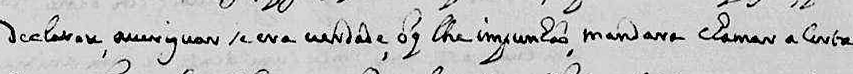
declarou, aueriguar se era uerdade, o q̄ lhe impunhaõ, mandara chamar a certa
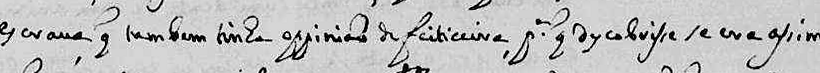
escraua, q̄ tambem tinha oppiniaõ de feiticeira, p.a q̄ descobrisse se era assim
